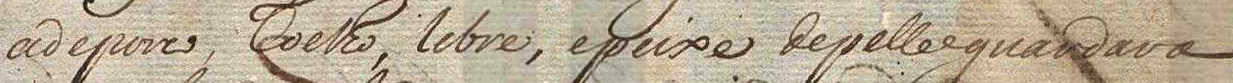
a de porco, Coelho, lebre, e peixe de pelle e guardava
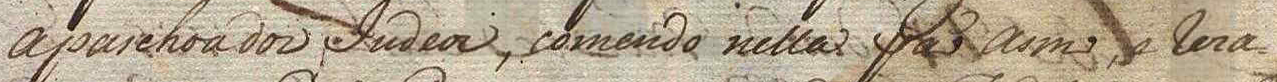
a paschoa dos Iudeos, comendo nella paõ asmo, e Reza
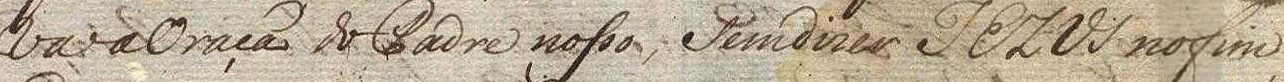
va a Oração do Padre nosso, sem dizer IEZVS no fim,
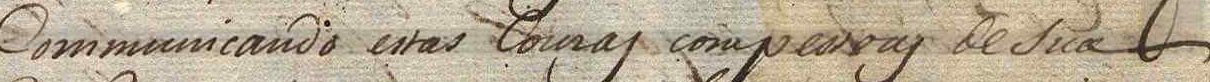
Communicando estas Couzas com pessoas de sua
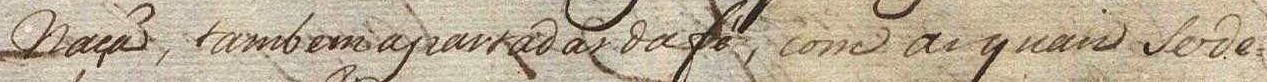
naçaõ, tambem apartadas da fé, com as quais se de
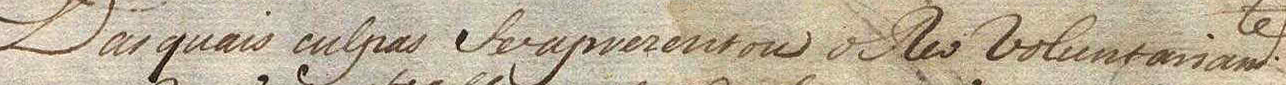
Das quais culpas se aprezentou o Reo Voluntariam.te
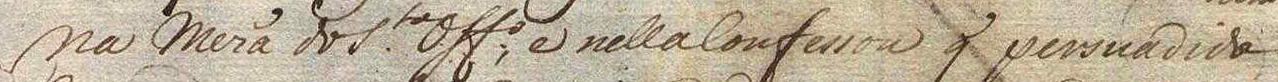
na meza do s.to off.o, e nella confessou q̄ persuadido
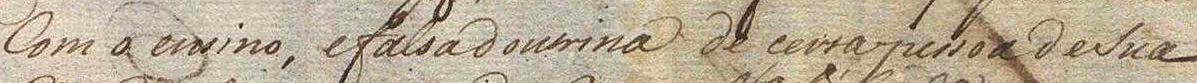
com o ensino, e falsa doutrina de certa pessoa de sua
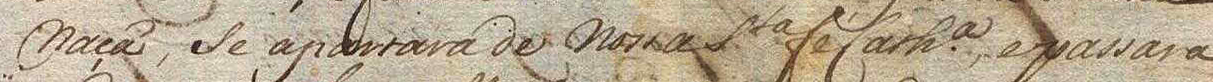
naçaõ, se apartara de nossa s.ta fé Cath.o, e passara
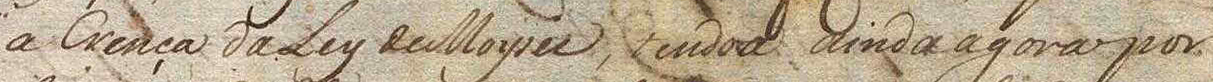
a crença da Ley de Moyses, tendoa ainda agora por
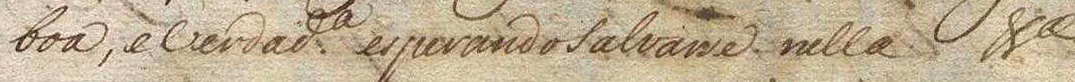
boa, e verdad.a esperando salvarse nella &a
